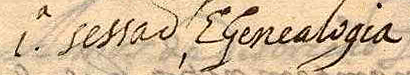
1a sessaõ, e Genealogia
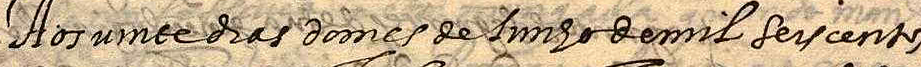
Aos vinte dias do mes de Junho de mil seiscentos
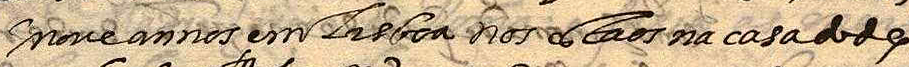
e nove annos em Lisboa nos estaos na casa do des
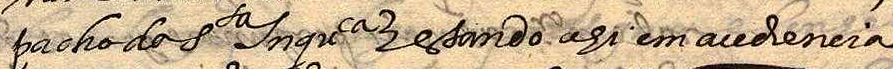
pacho da Sta Jnquca e estando ahi em audiencia
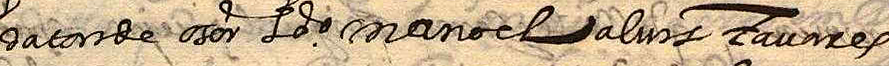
da tarde o sōr Ldo manoel alvrs̄ tavares
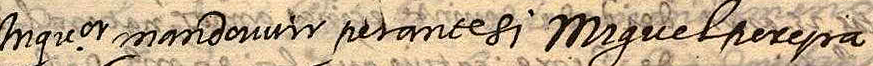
Inqu.or mandou vir perante si miguel perejra
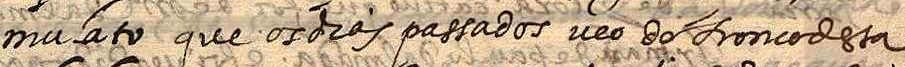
mulato que os dias passados veo do tronco desta
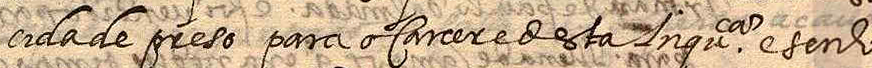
cidade preso para o Carcere desta Inqu.cão e sendo
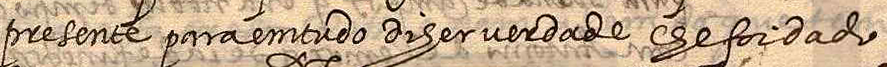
presente para em tudo dizer verdade lhe foi dado
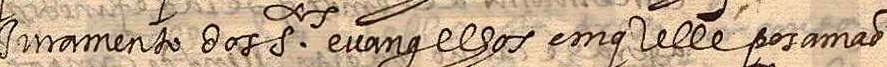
Juramento dos S.tos evangelhos em q̄ elle por a maõ
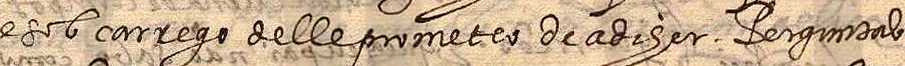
e sob carrego delle prometeo de a dizer. Perguntado
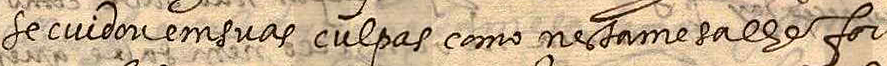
se cuidou em suas culpas como nesta mesa lhe foi
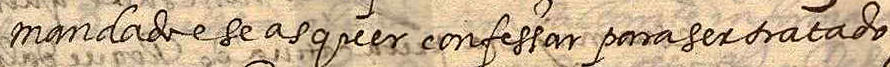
mandado e se as quer confessar para ser tratado
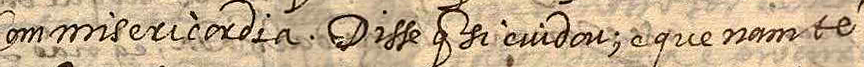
com misericordia. Disse q̄ si cuidou; e que nam tē
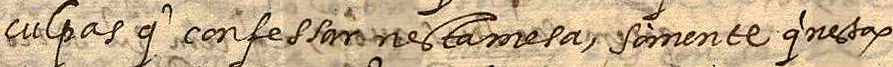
culpas q̄ confessar nesta mesa somente q̄ nestas
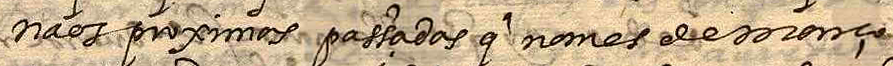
náos proximas passadas q̄ no mes de março
